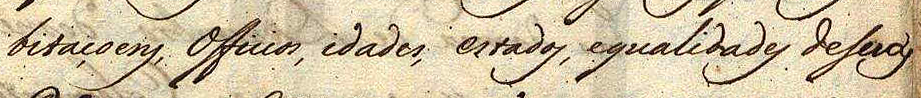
bitaçoens, Officios, idades, estados, e qualidades de suas
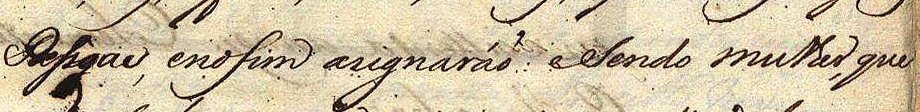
Pessoas, e no fim asignaraõ: e Sendo mulher, que
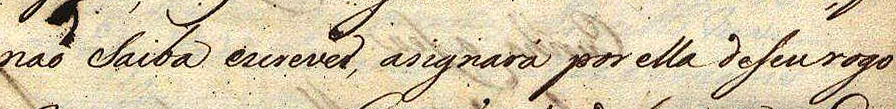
naõ Saiba escrever, asignará por ella de seu rogo
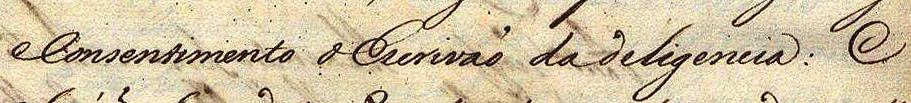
e Consentimento o Escrivaõ da deligencia: E
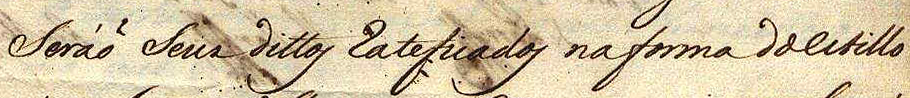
Serão seus dittos Rateficados na forma do estillo
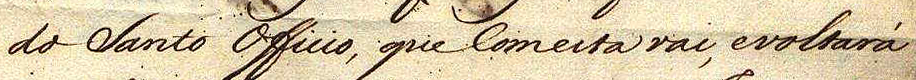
do Santo Officio, que com esta vai, e voltará
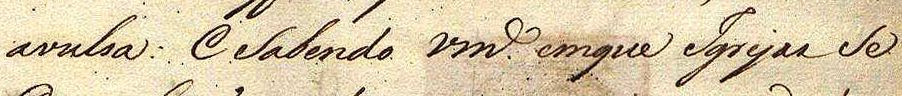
avulsa: E sabendo v m.e em que Igrejas se
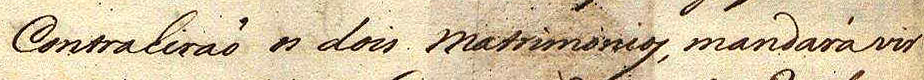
Contrahiraõ os dois matrimonios, mandará vir
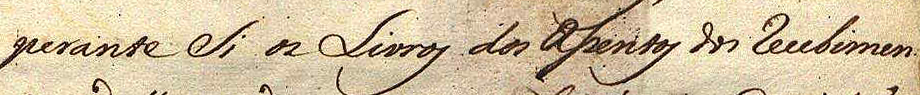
perante Si os Livros dos Assentos dos Recebimen
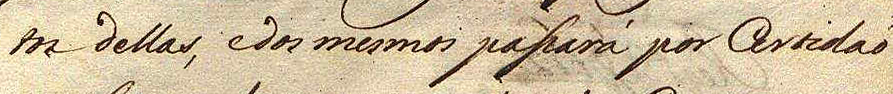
tos dellas, e dos mesmos passara por Certidaõ
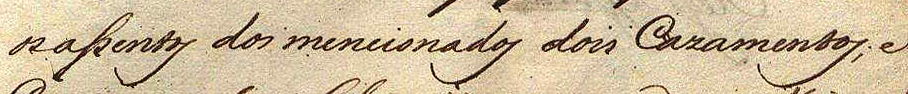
os assentos dos mencionados dois Cazamentos; e
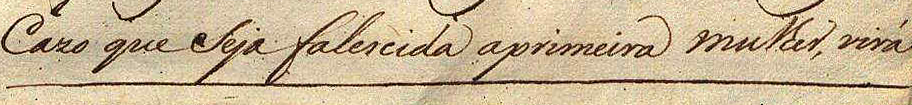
Cazo que seja falescida a primeira mulher, virá
